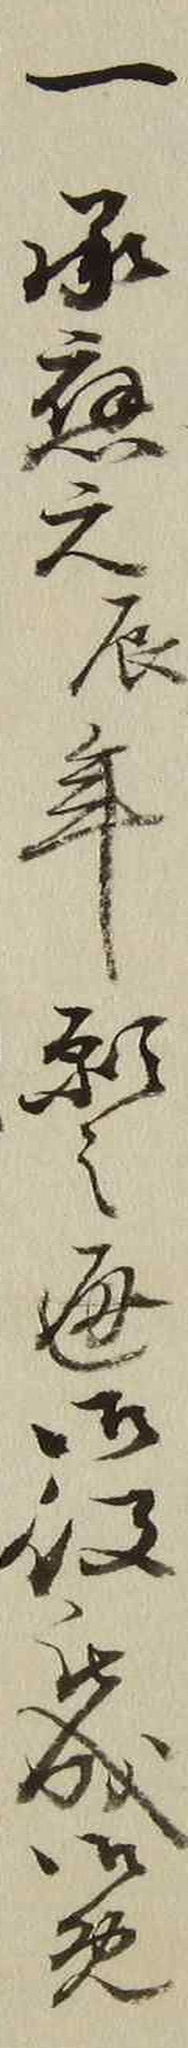一承応元辰年願之通御役被成御免
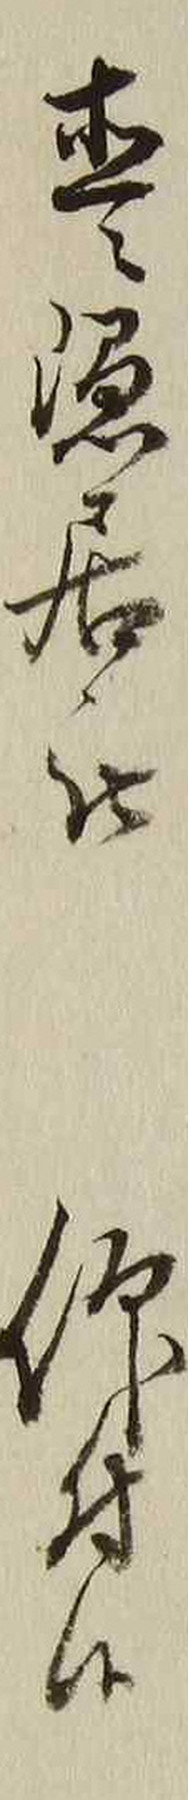直ニ隠居被仰付候
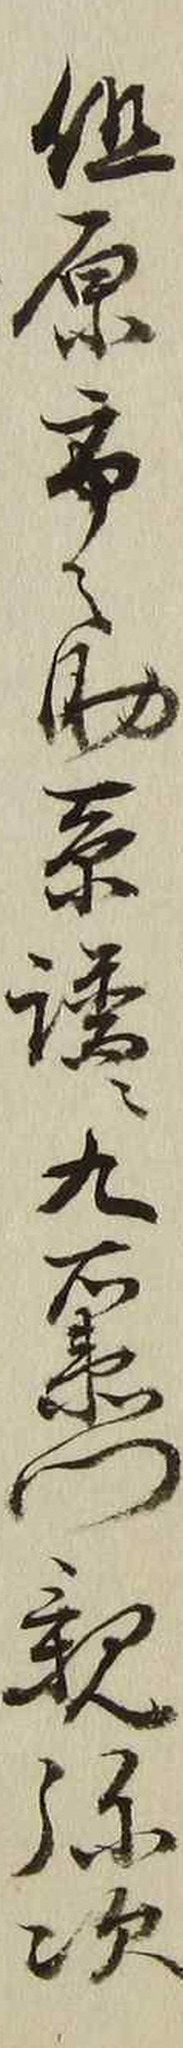但原市之助系譜ニ九右衛門親弥次
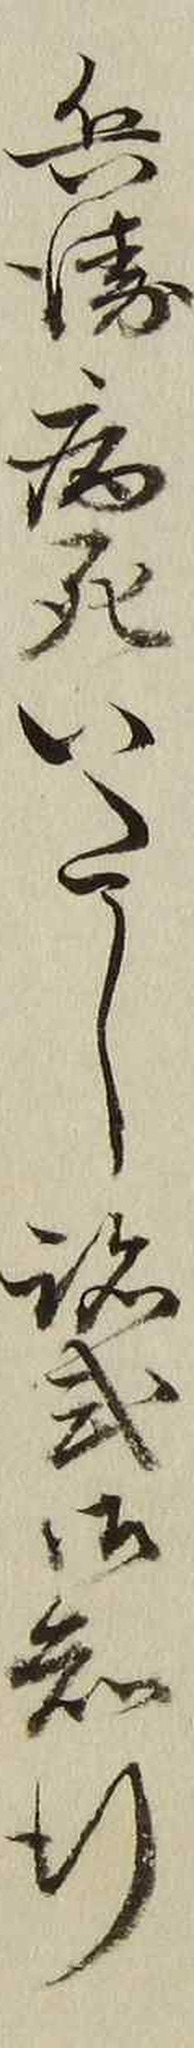兵衛病死いたし跡式御知行
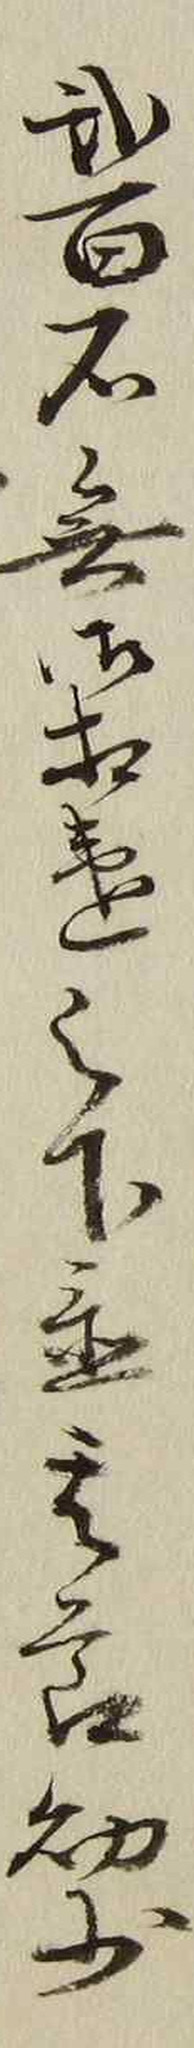弐百石無御相違被下置其節幼少
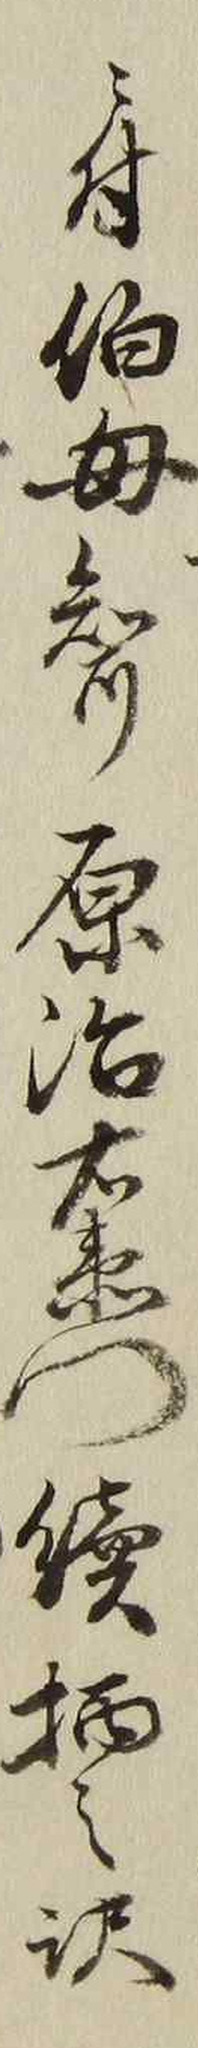ニ付伯母婿原治右衛門続柄之訳
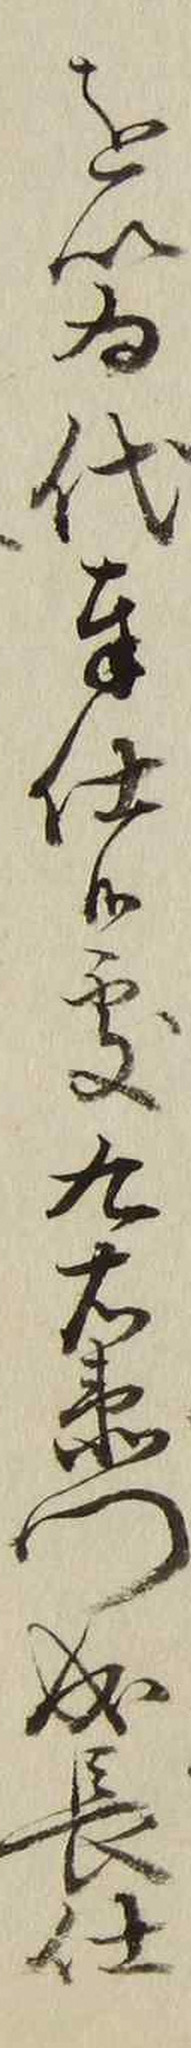を以為代奉仕候処九右衛門成長仕
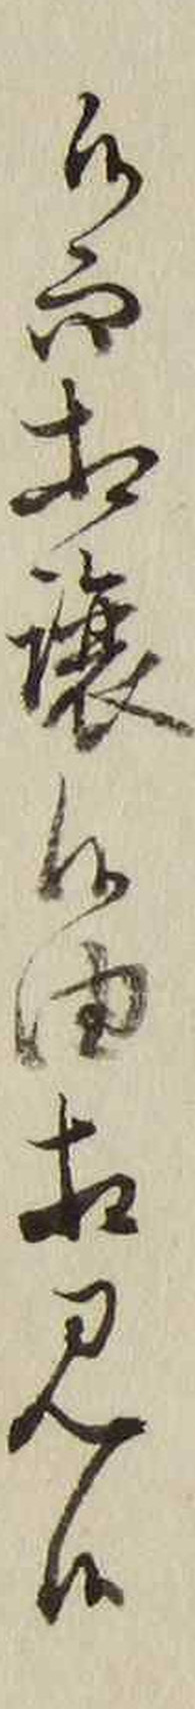候而相譲候由相見候

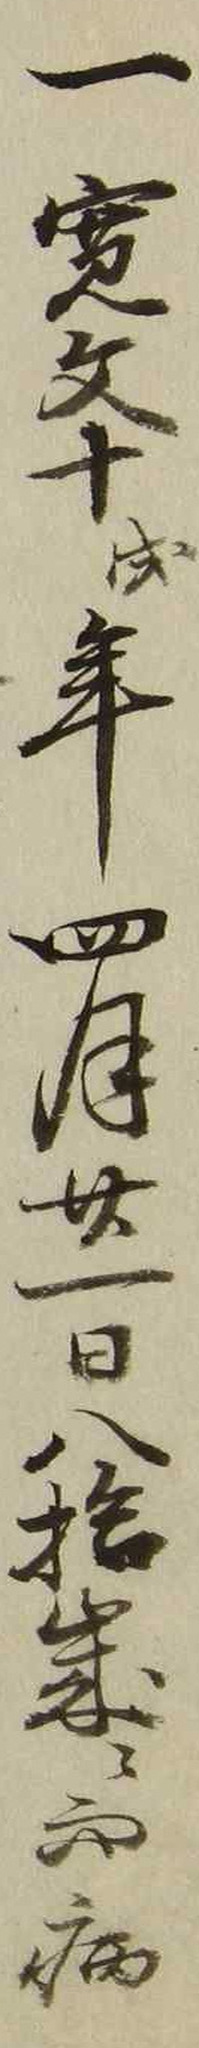一寛文十戌年四月廿一日八拾歳ニ而病
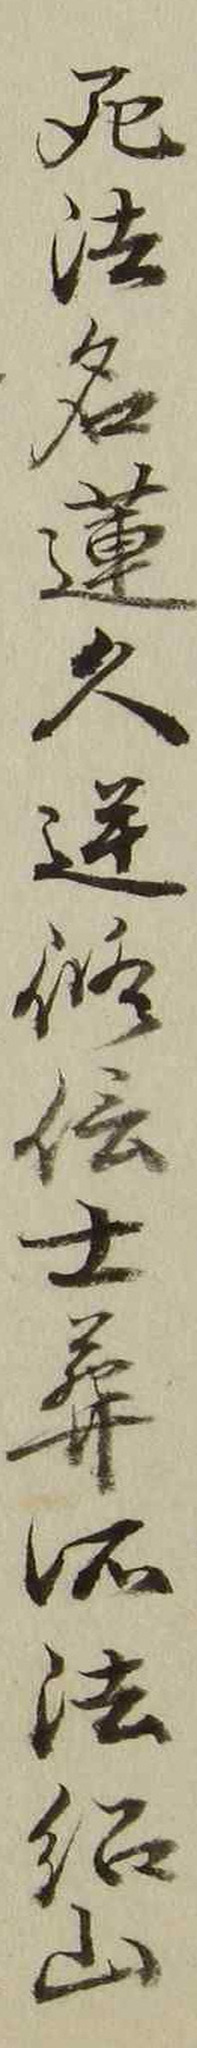死法名蓮久逆修信士葬所法紹山
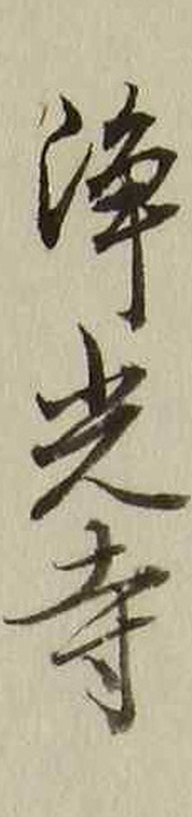浄光寺
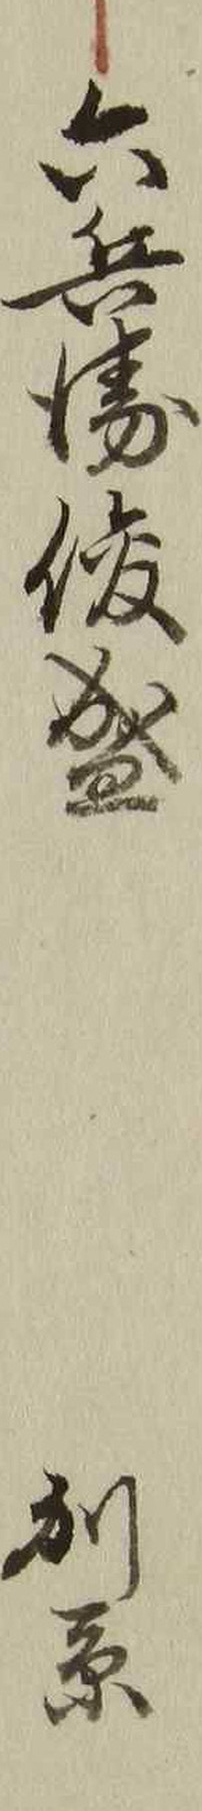六兵衛俊盛別系
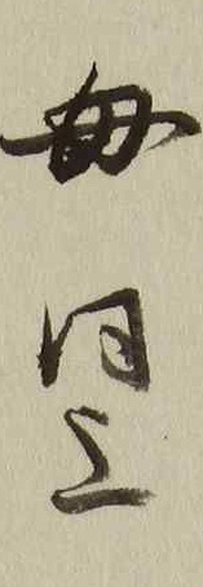母同上
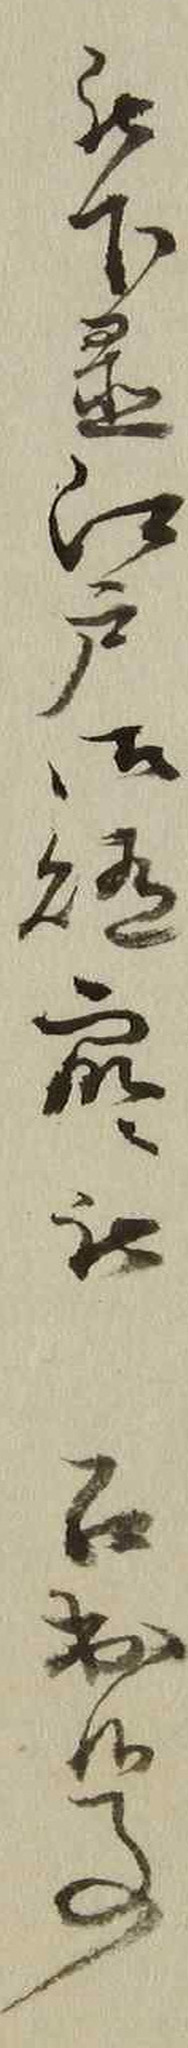被下置江戸御賄衆ニ被召出候事
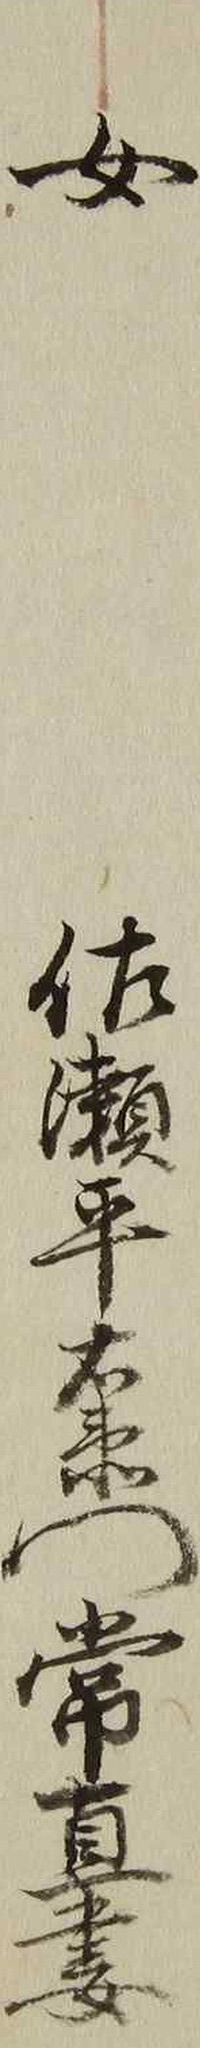女佐瀬平右衛門常直妻
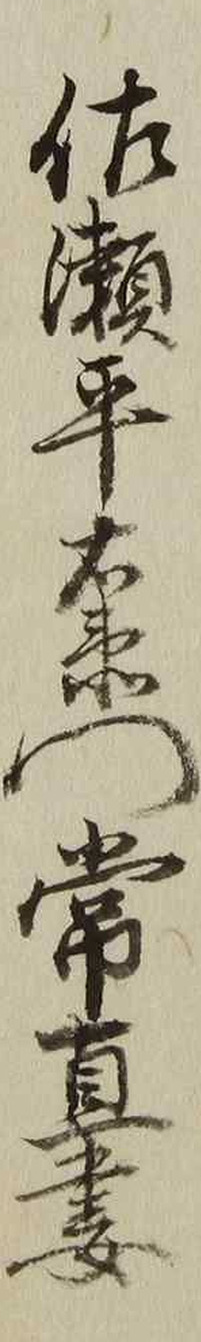女佐瀬平右衛門常直妻
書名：諸士系譜　巻之36　は之部4
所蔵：会津若松市立会津図書館
